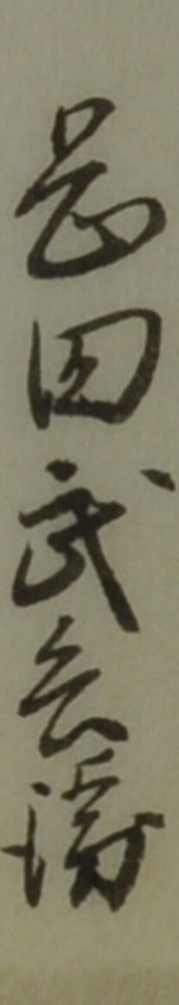岡田武兵衛
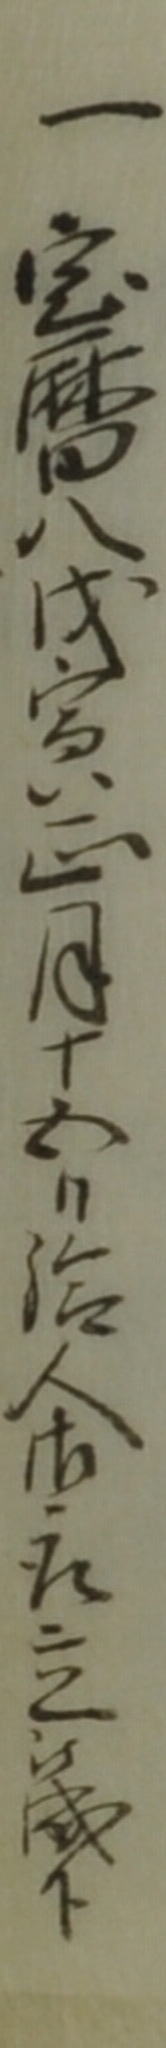一宝暦八戊寅正月十五日給人御取立被成下
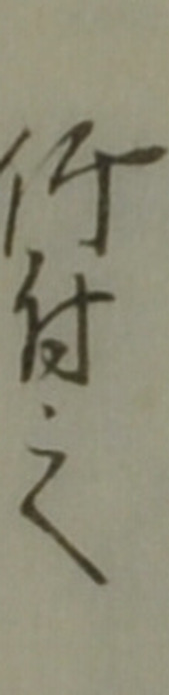仰付之
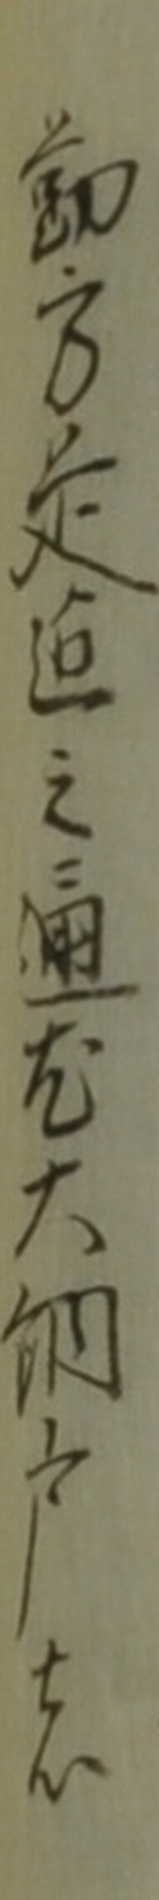勤方是迄之通尤大納戸者
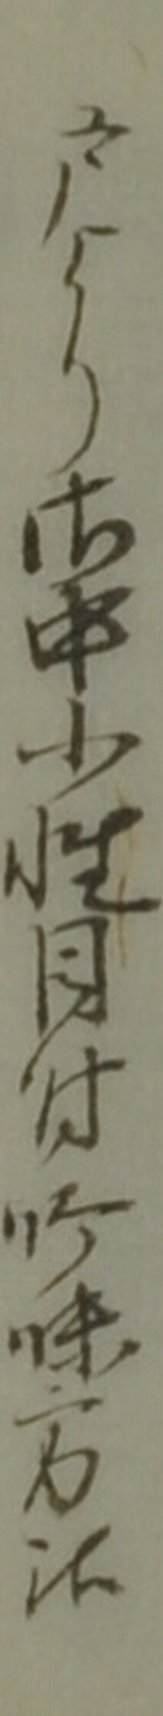戸より御中小姓目付吟味方被
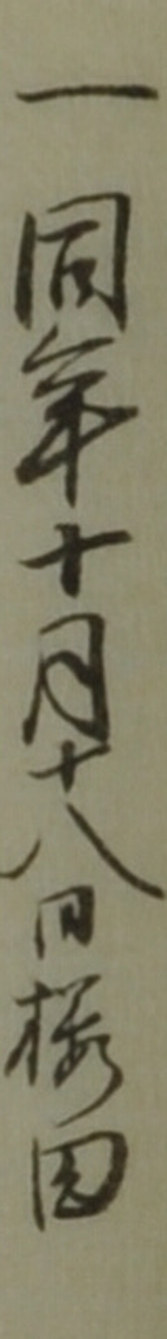一同年十月十八日桜田
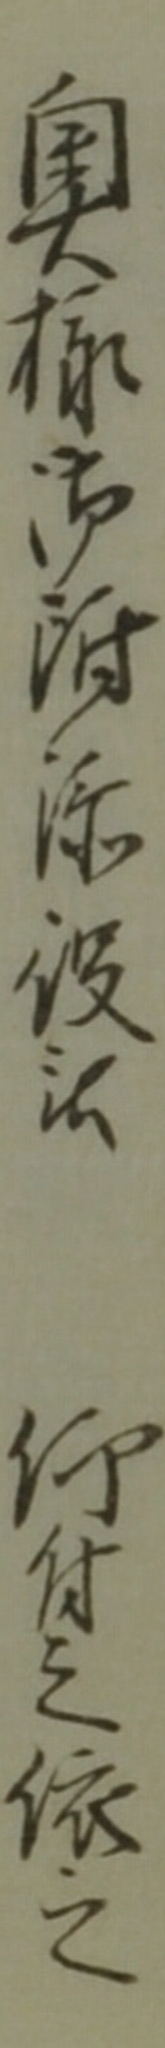奥様御附添役被仰付之依之
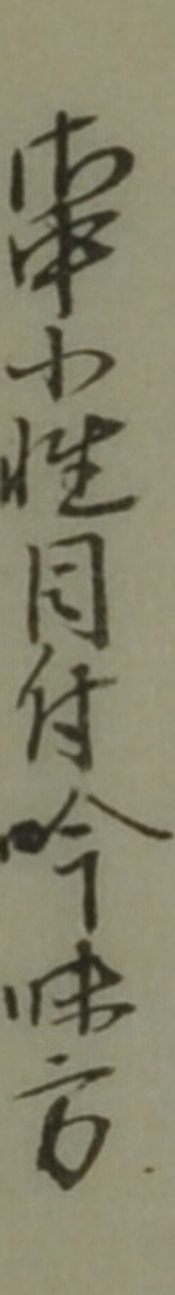御中小姓目付吟味方
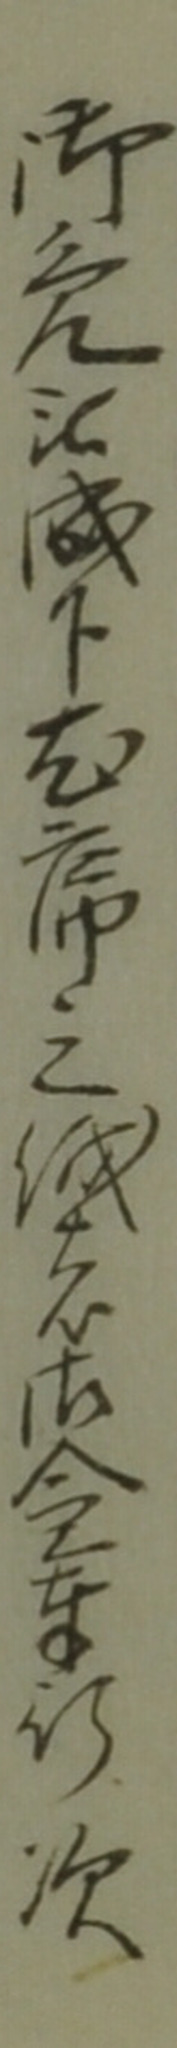御免被成下尤席之儀者御金奉行次
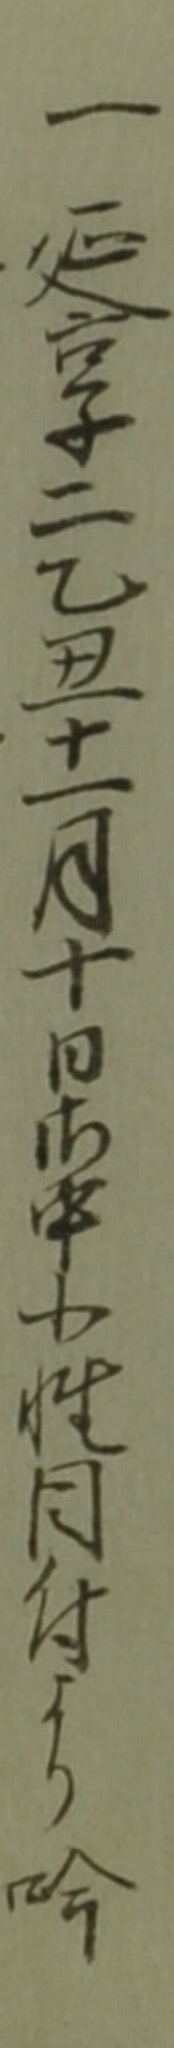一延享二乙丑十一月十日御中小姓目付より吟
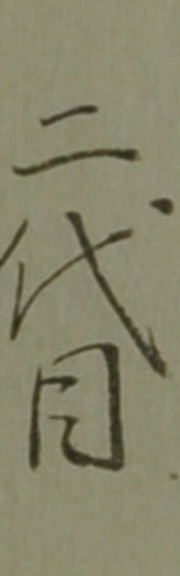二代目
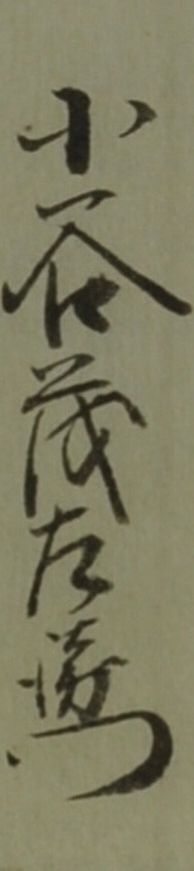小谷茂左衛門
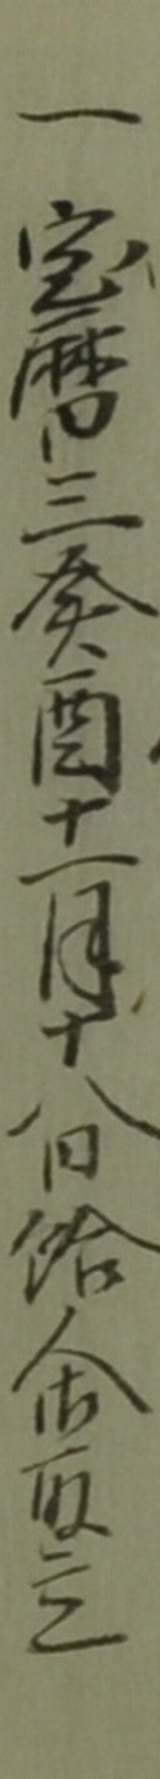一宝暦三癸酉十一月十八日給人御取立
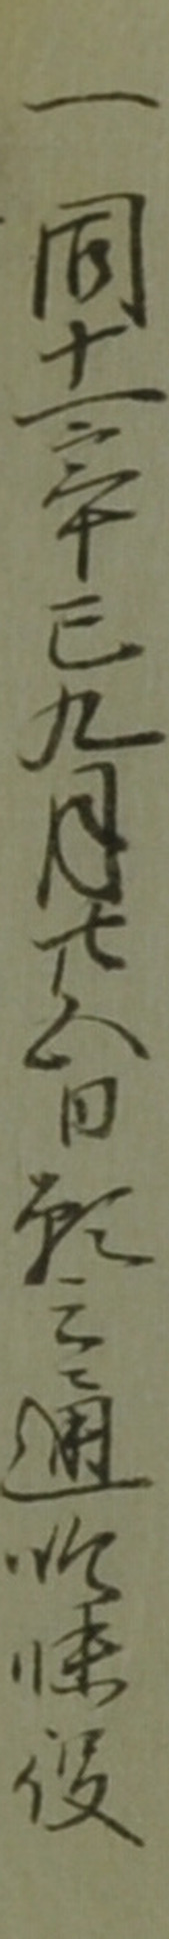一同十一辛巳九月廿五日願之通吟味方
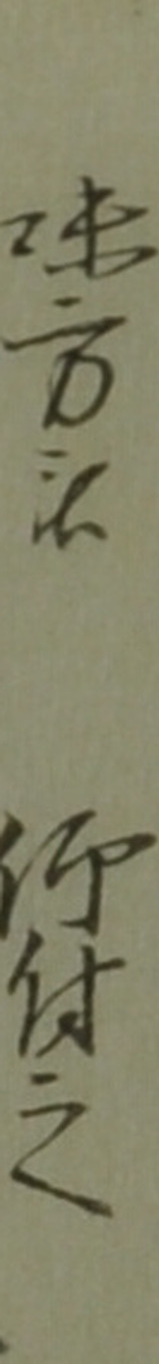味方被仰付之
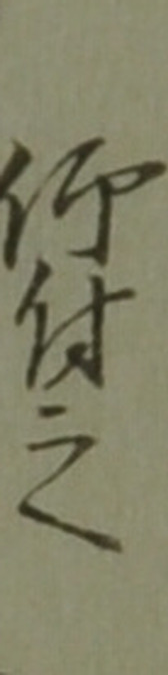仰付之
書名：諸御役代々録（八）
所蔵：伊那市立高遠町図書館・合同会社AMANE
